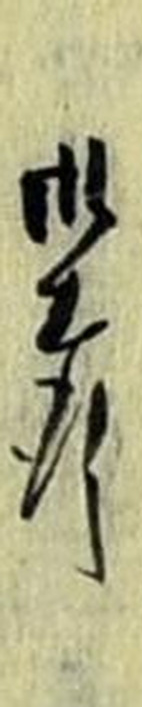御奉行
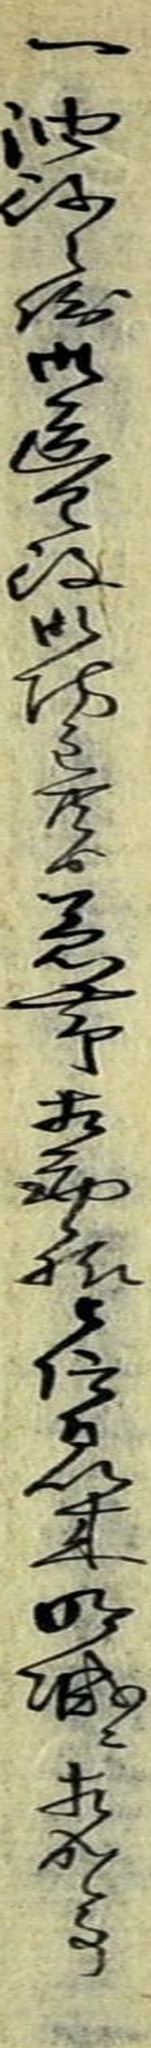一油役之儀御道具役御坊主共ゟ兼帯相勤候様被仰付以来明減ニ相成候事
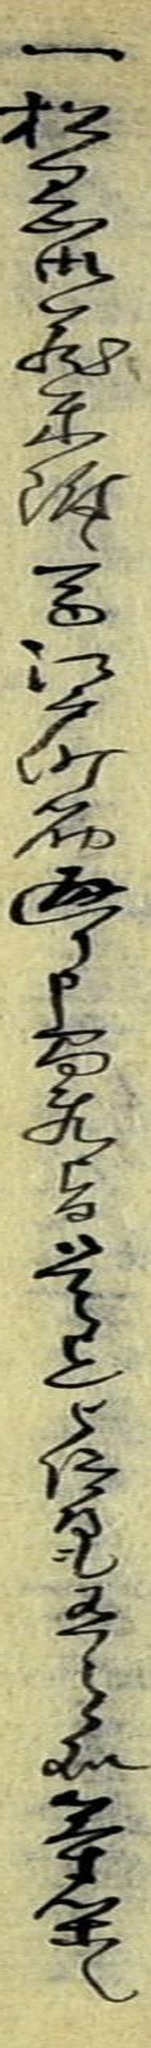一松岡御蔵米付候馬江戸町筋通り申間敷旨是迄被仰付も有之候処等閑之
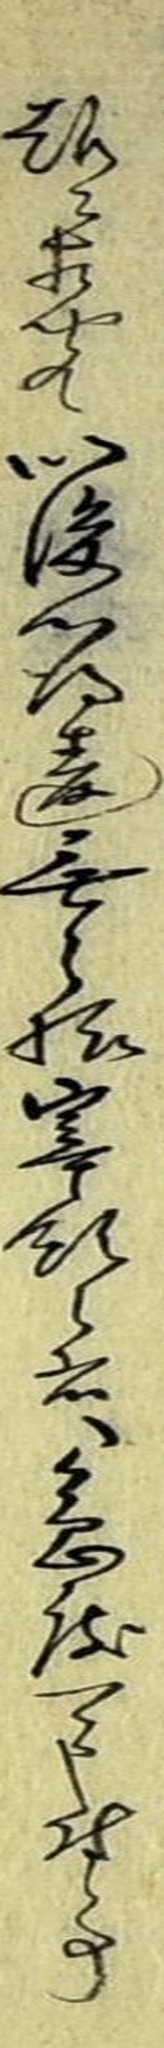趣ニ相聞候以後心得違無之様宰領之者へ急度可申付候事
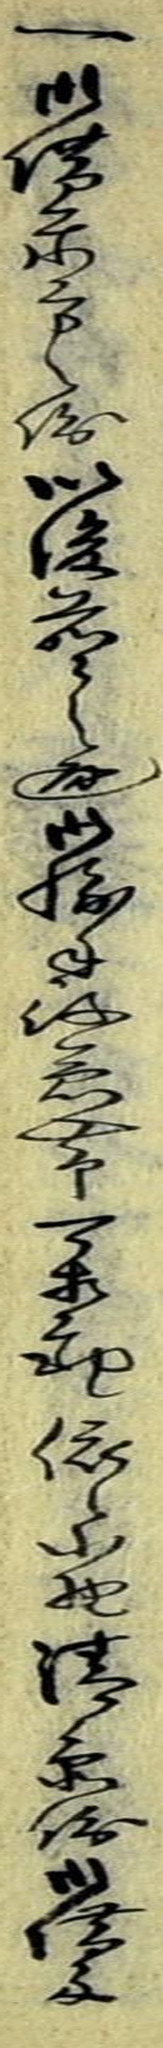一御借米方之儀以後前々之通御勝手役兼帯可相勤候依之小野清兵衛儀御借米
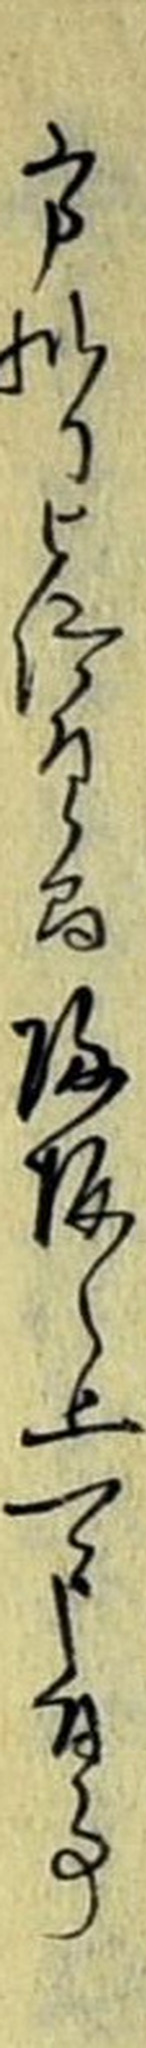方掛り被仰付候間帰坂之上可申付事

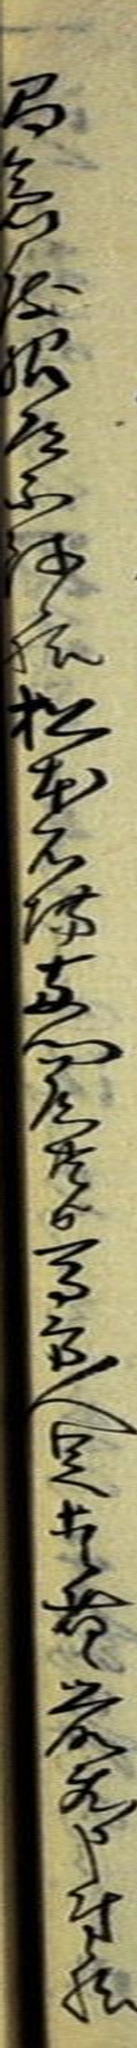間急度脇道不致候様松本石場両問屋共ゟ馬方人足等之者へ厳敷申付候様
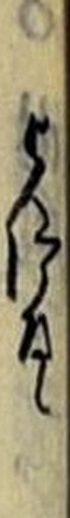被仰付候

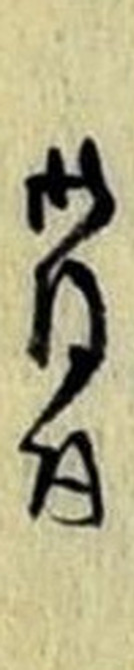御目付
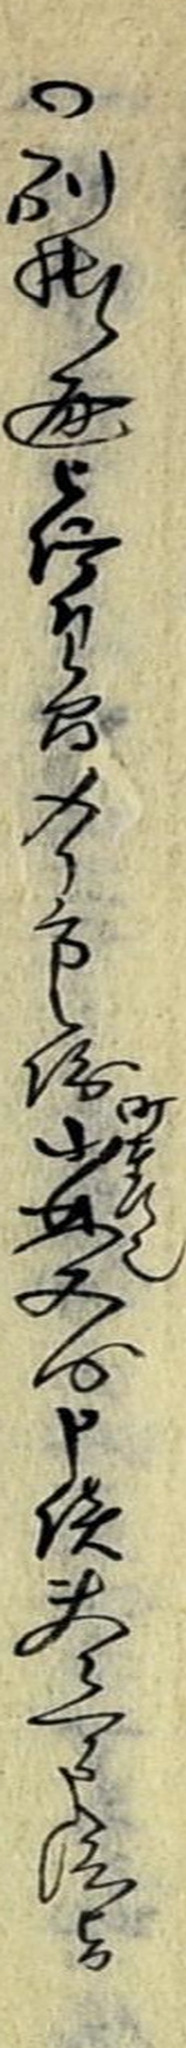〇別紙之通被仰付候間〆り方之儀小林又右衛門申談夫々可申渡旨
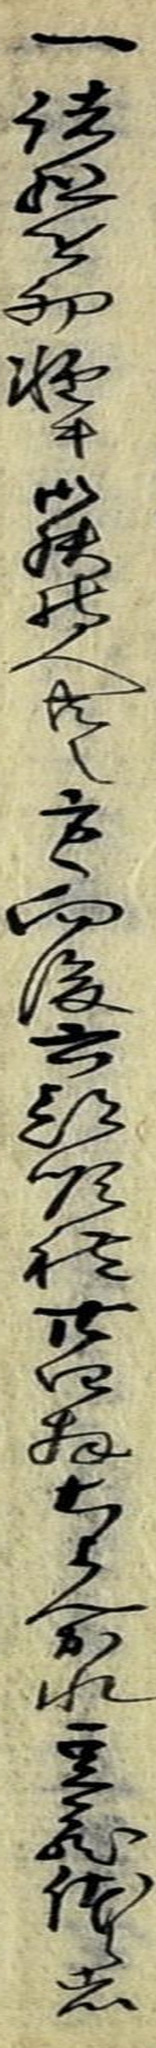一諸組を初軽キ御扶持人共之方へ向後六部順礼廿四拝ちょんかれ豆蔵体之者
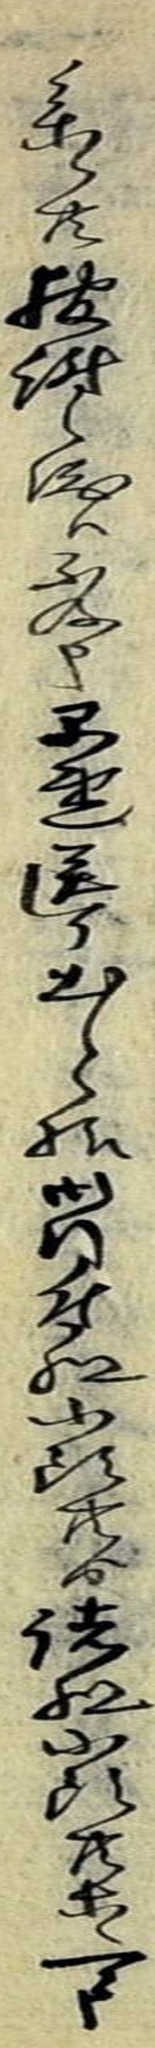参候共報謝之儀ハ不及申早速送り出候様御目付組小頭共ゟ諸組小頭共等へ可申
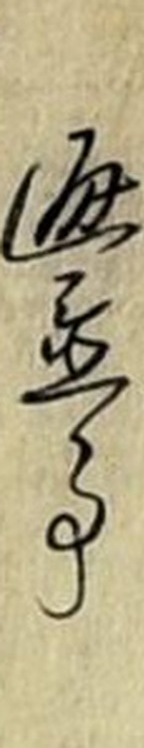通置事
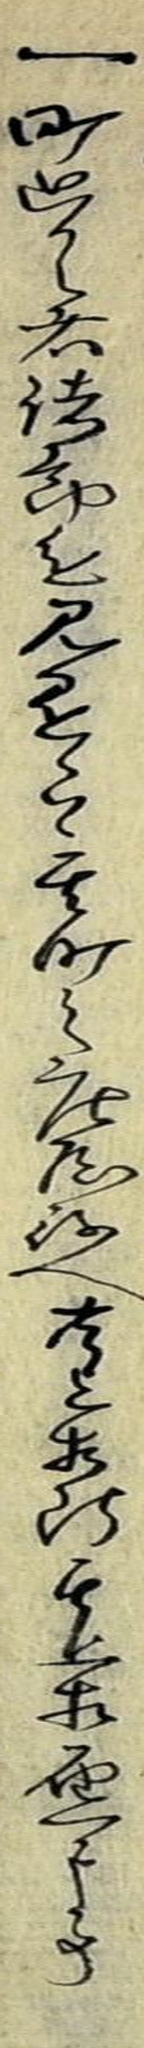一町廻り之者諸を見懸候ハヽ其町之庄屋役人共迄相断其上相届可申事
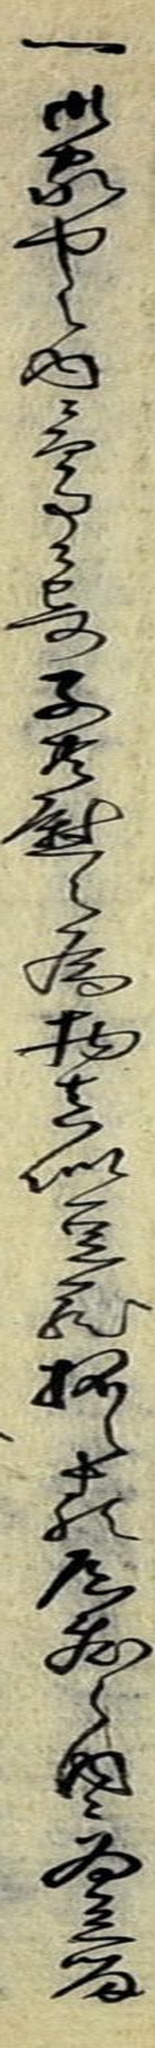一御家中之内ニ而事ニ寄子共慰之為物真似豆蔵抔之類屋敷之内ニ為立留
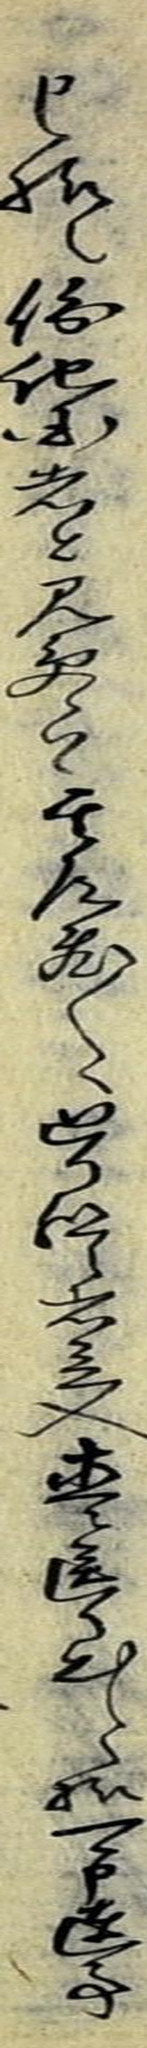申候様之儀他国者と見受候ハヽ其屋敷〳〵へ廻り組之者立入直ニ送り出候様可申達事
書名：命令之部 三
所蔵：福井県文書館 Fukui Prefectural Archives
